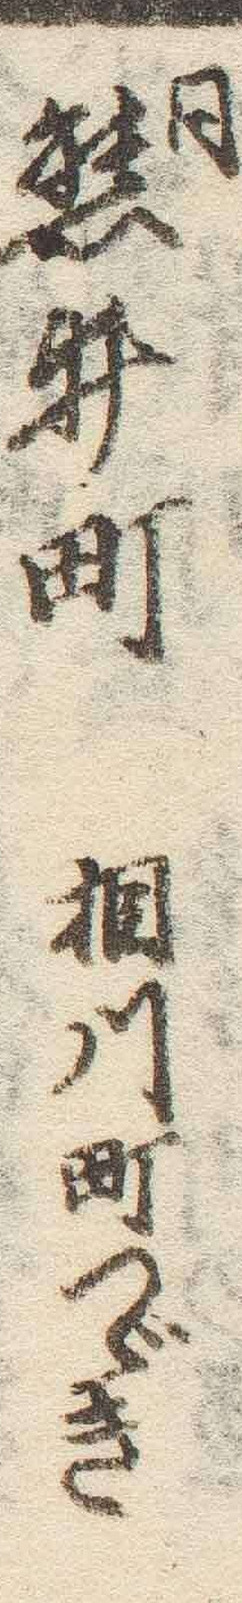熊井町相川町つゞき
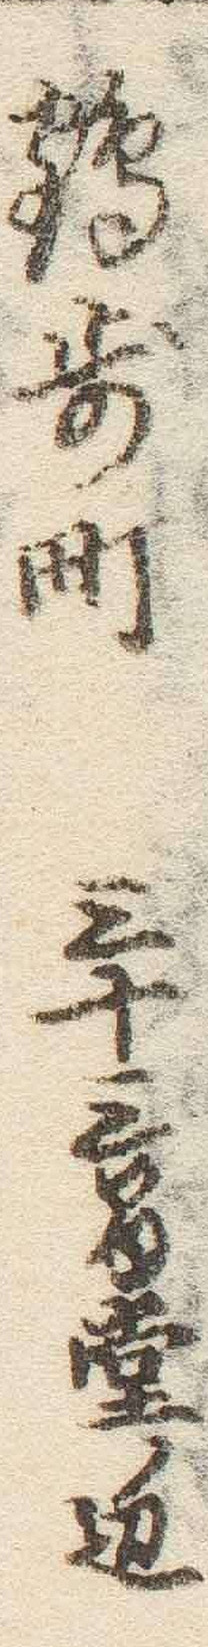鶴歩町三十三間堂ノ辺
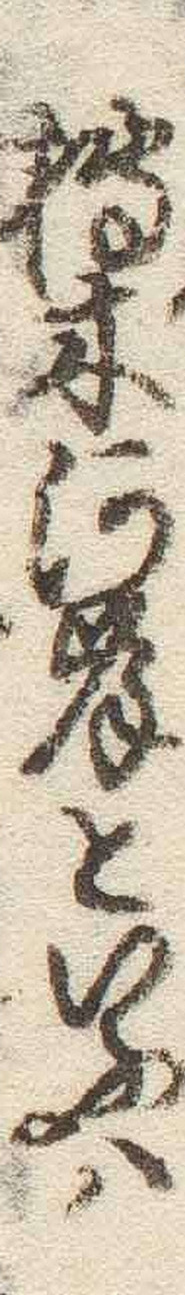榑木河岸といふは
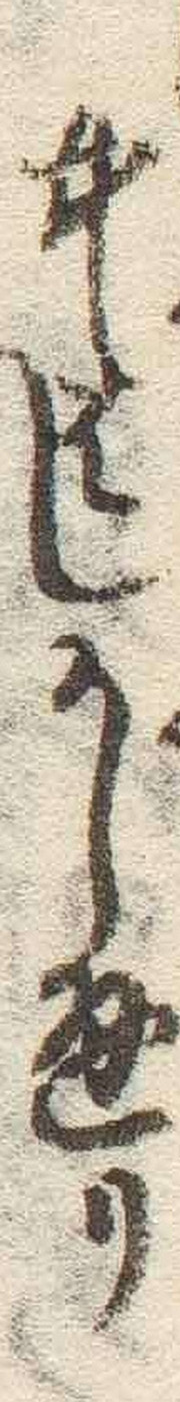中はしかし通り
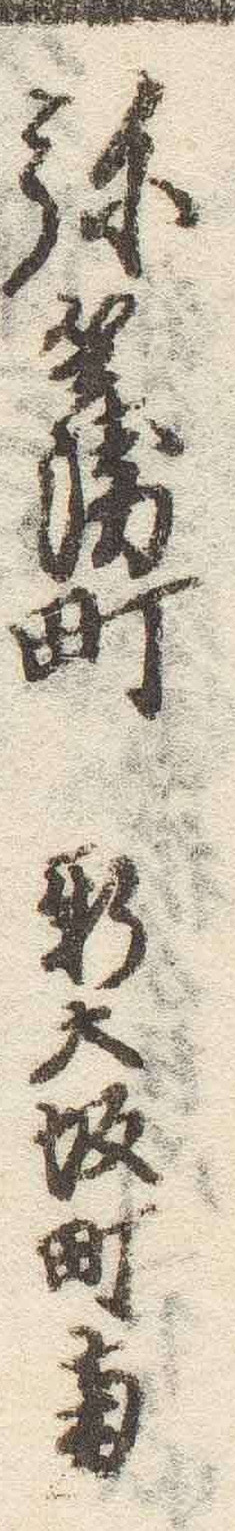弥兵衛町新大坂町南
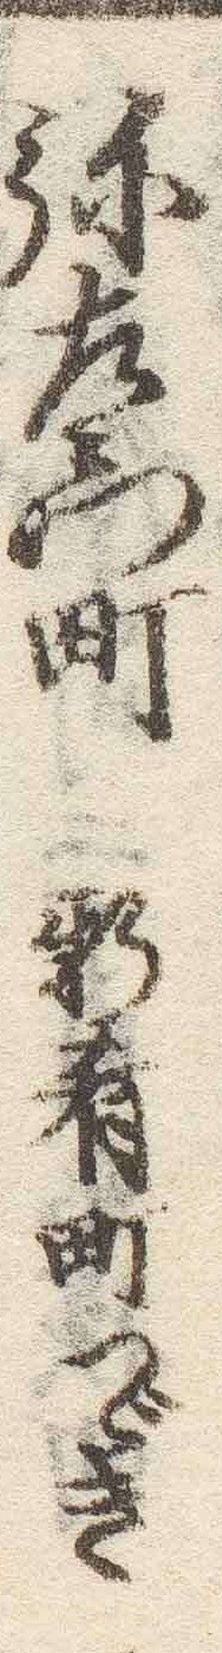弥左衛門町新肴町つゞき
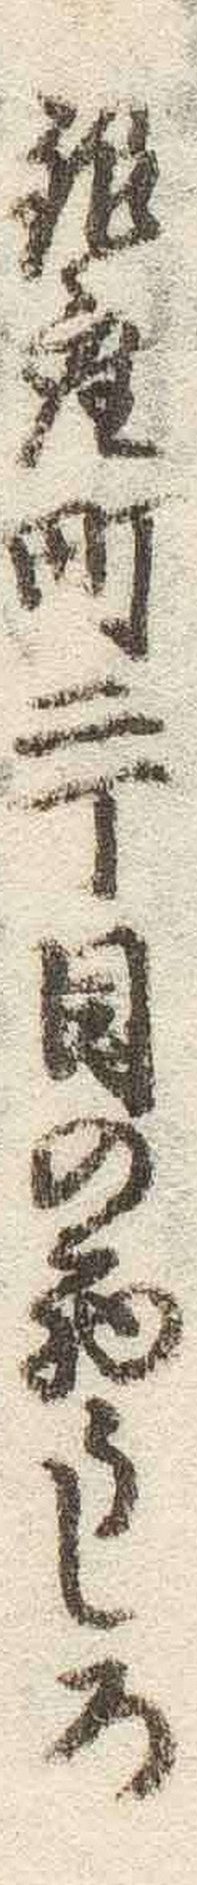銀座町二丁目の西うしろ
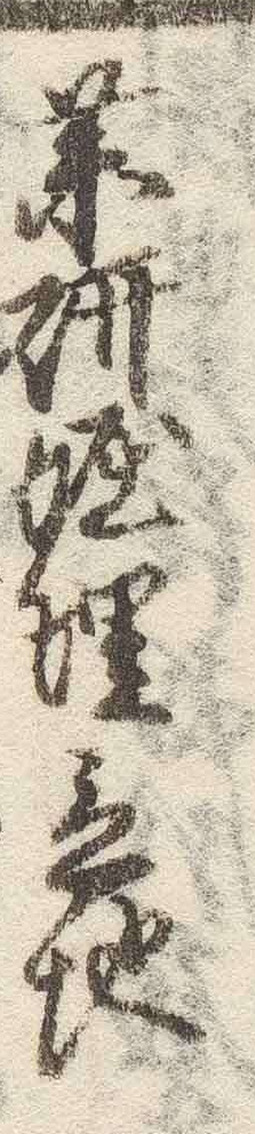薬研堀埋立地
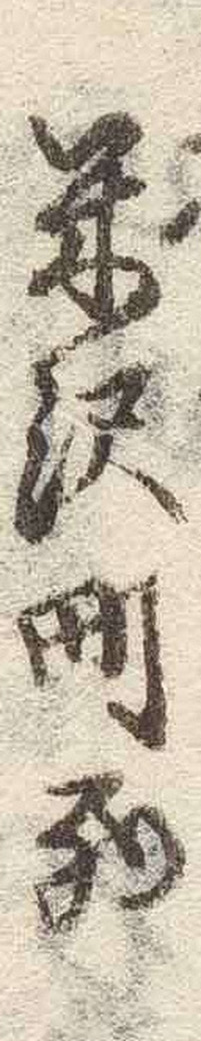米沢町西
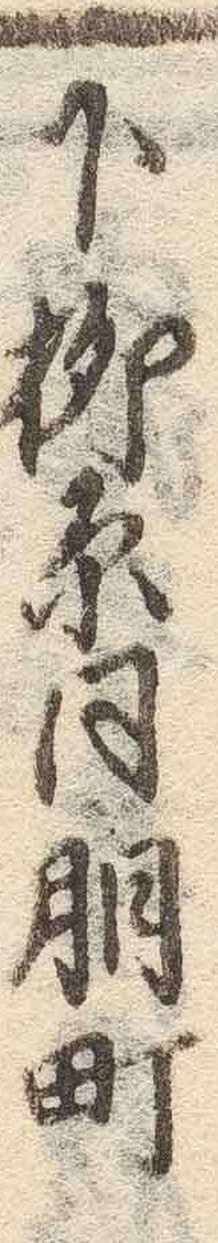下柳原同朋町
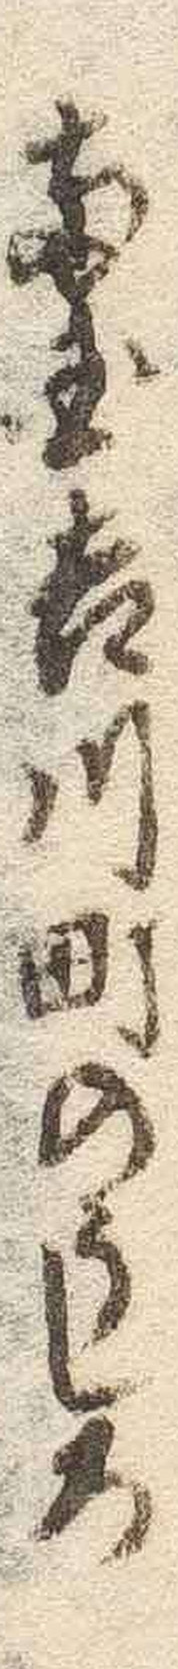両国吉川町のうしろ
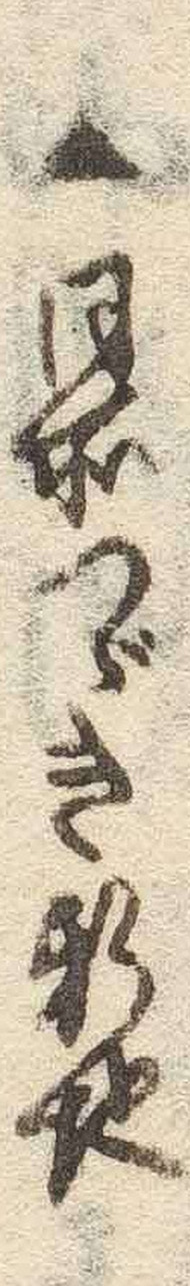▲同所つゞき新地
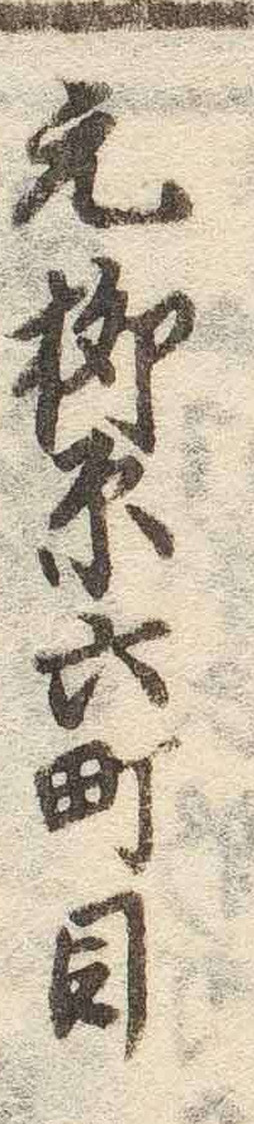元柳原六町目
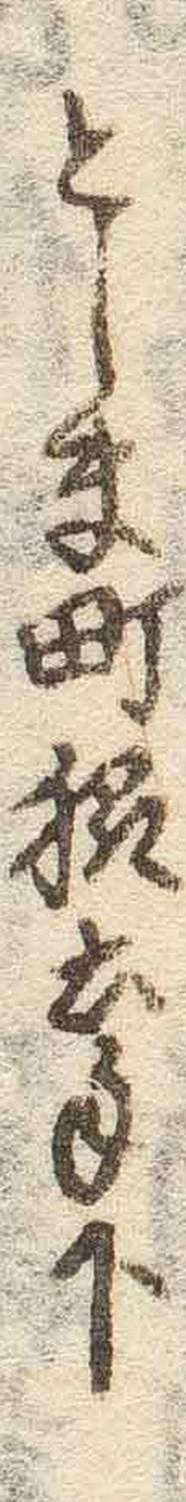としま町脇土手下
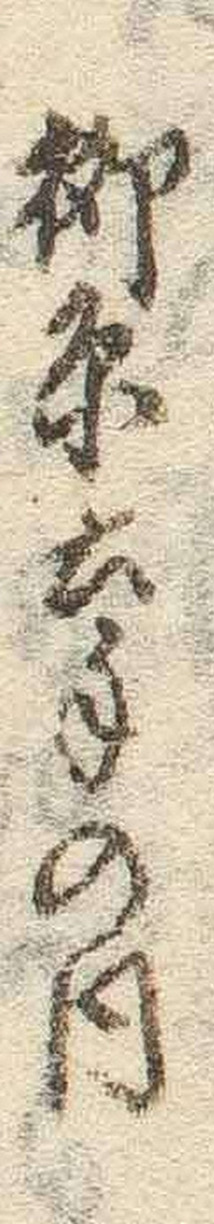柳原土手の内
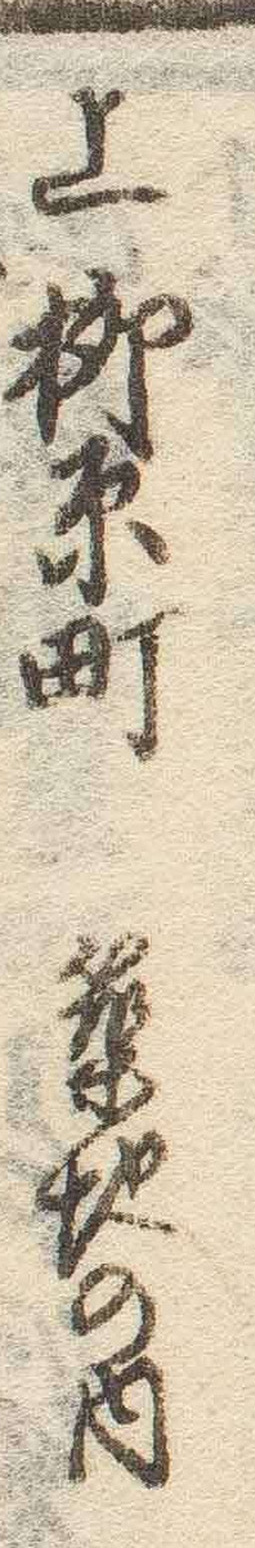上柳原町築地の内
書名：江戸町独案内
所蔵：東京学芸大学附属図書館 国文学研究資料館
